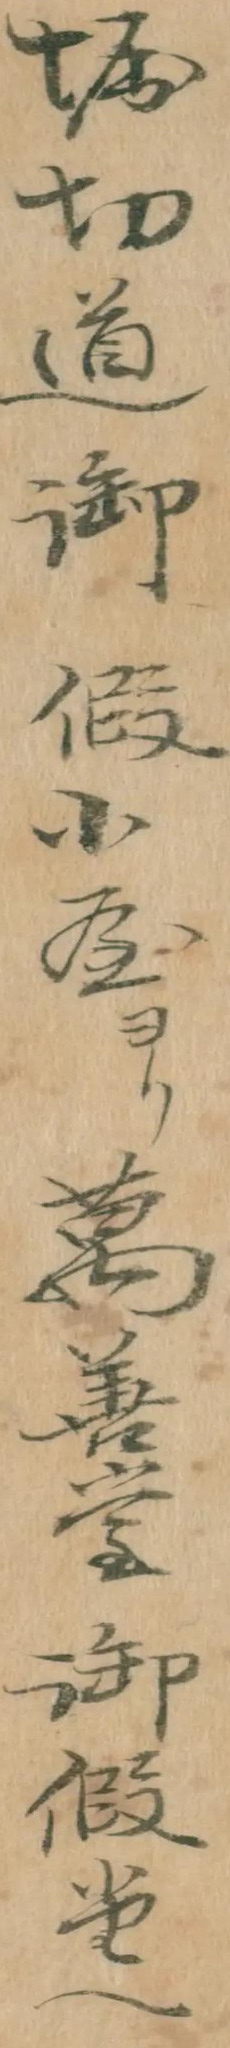堀切道御仮小屋ヨリ万善堂御仮堂へ
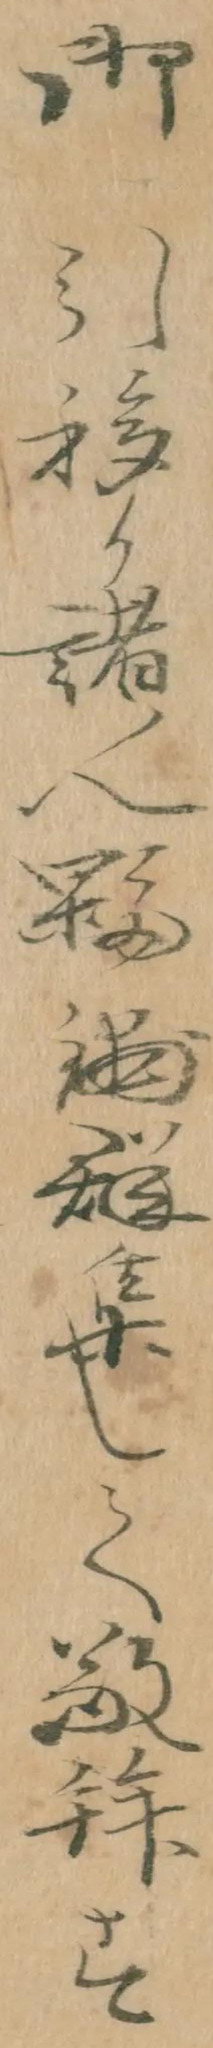御引移り諸人夥鋪群集して敬拝す

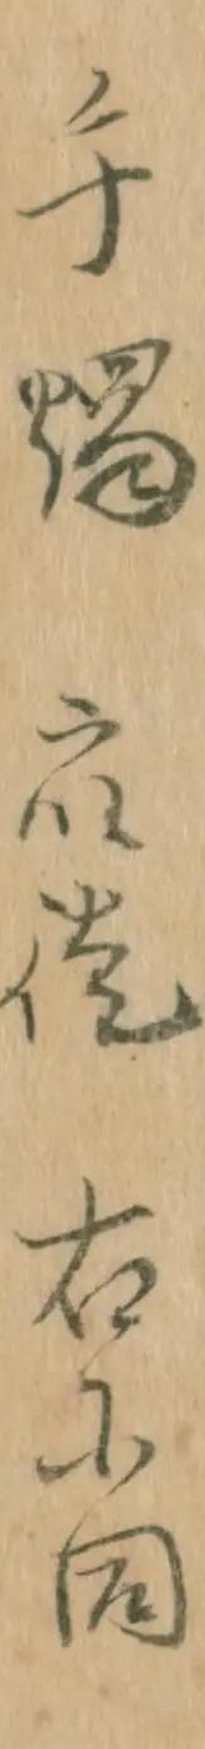手燭衆倦右に同
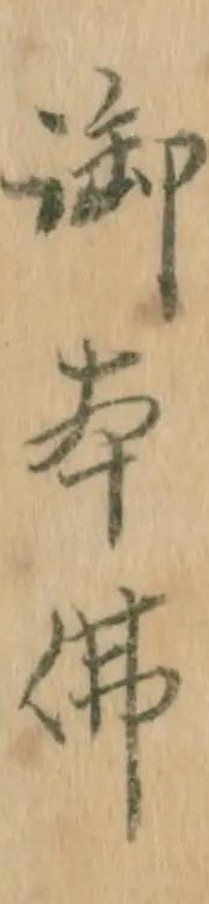御本仏
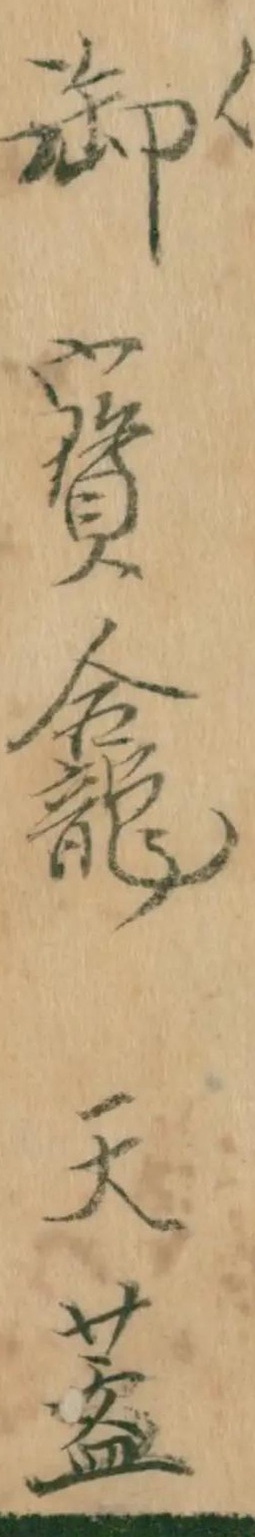御宝龕天蓋
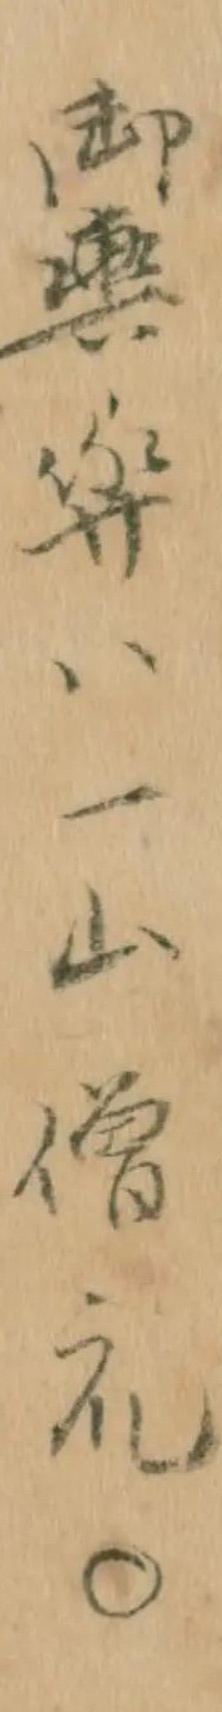御輿舁ハ一山僧衆○
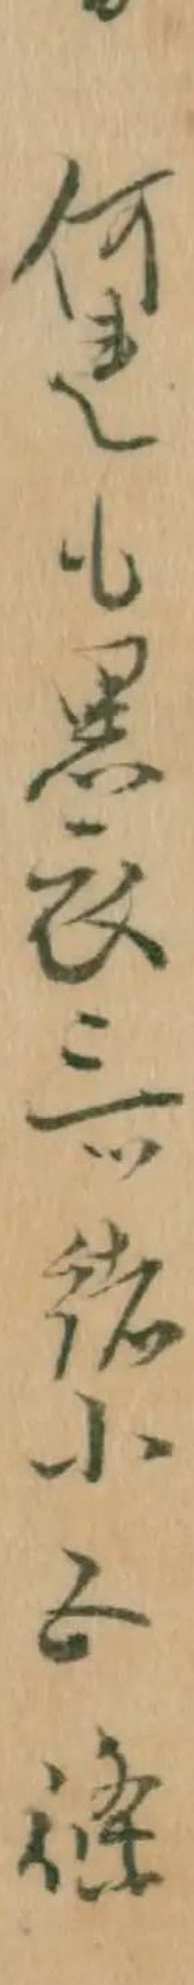何れも黒衣三ツ緒小五條
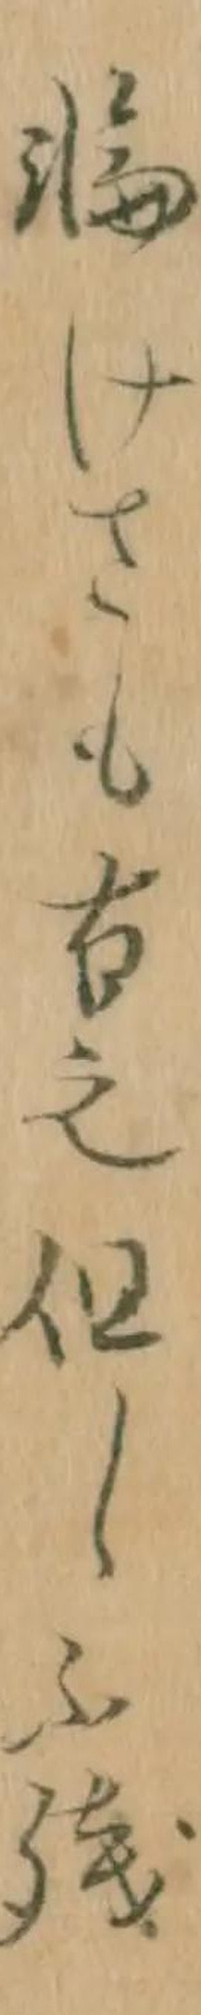輪けさも有之但し不残
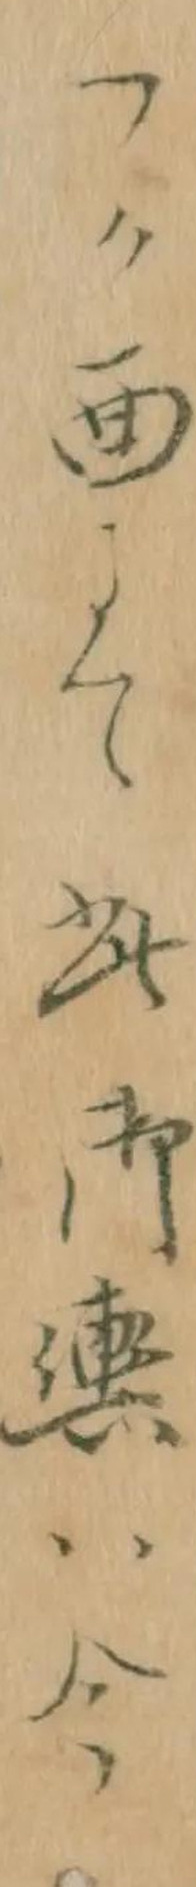フク面にて此御輿は今
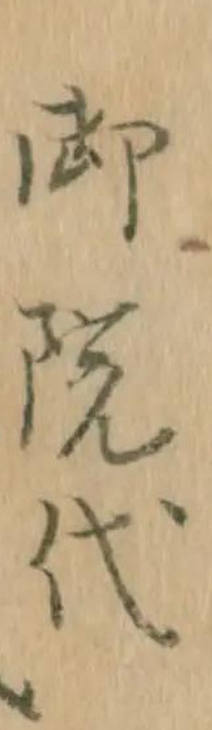御院代
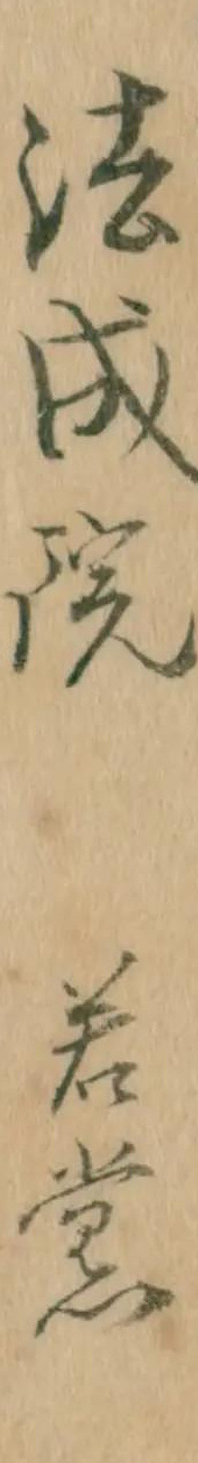法成院若党
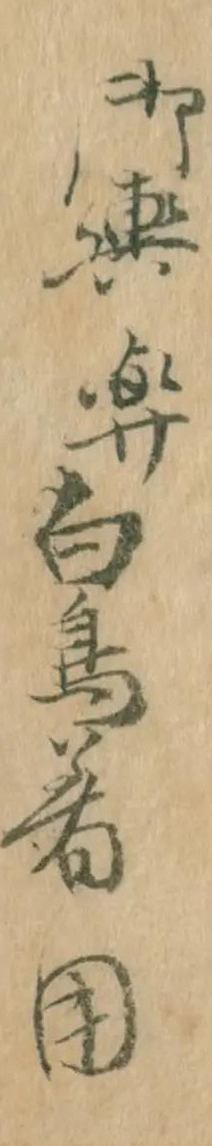御輿舁白鳥着用

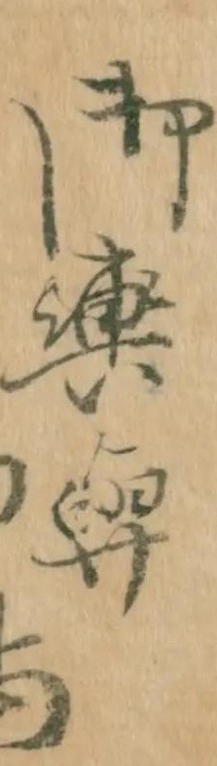御輿舁
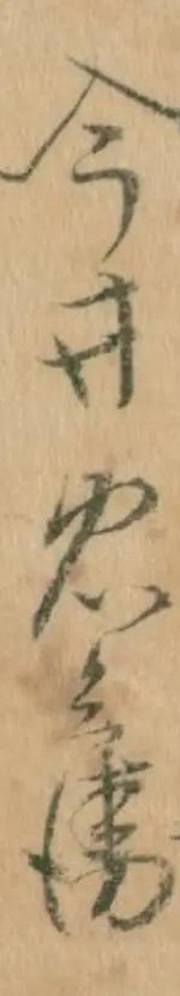今井忠兵衛
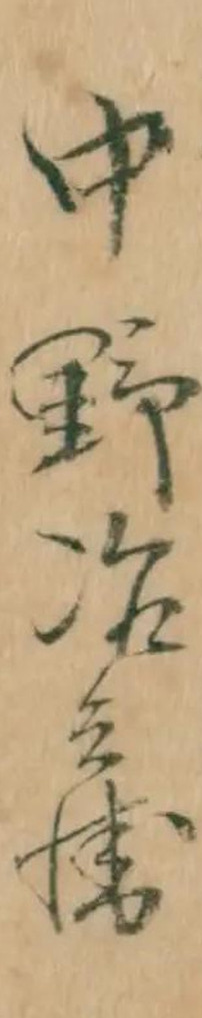中野冶兵衛
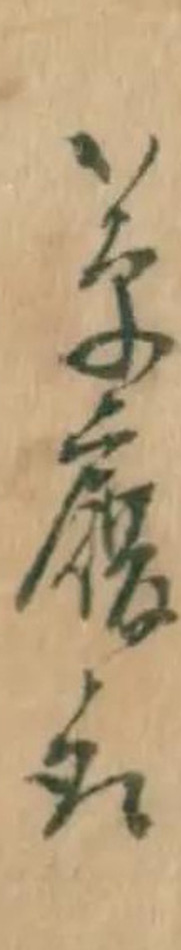草履取
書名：俗語之種. [7]
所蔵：国立国会図書館 National Diet Library, JAPAN
